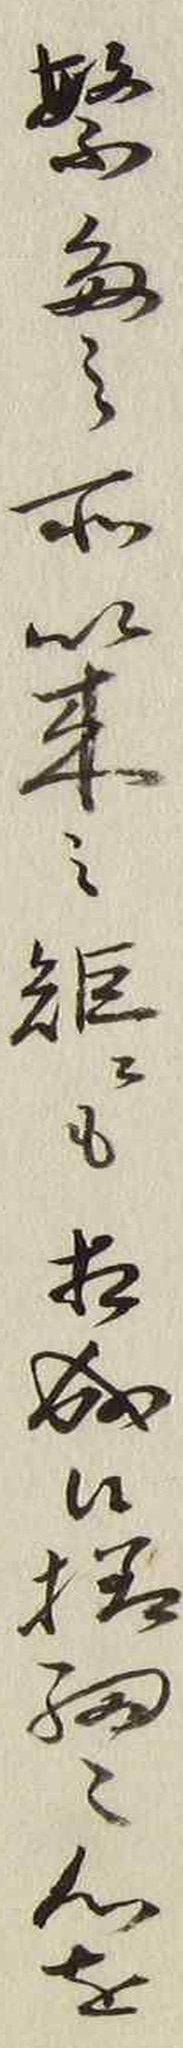繁多之所以来之短にも相成候様細々心を
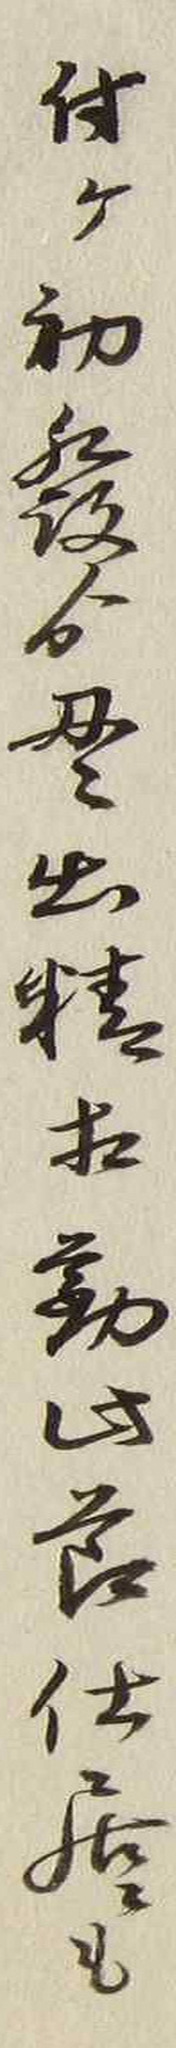付ケ初発ゟ畳出精相勤此節仕居にも

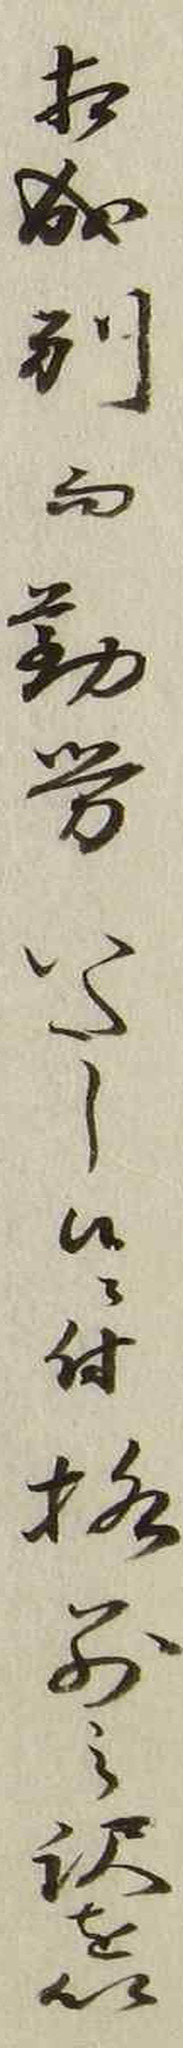相成別而勤労いたし候ニ付格別之訳をい
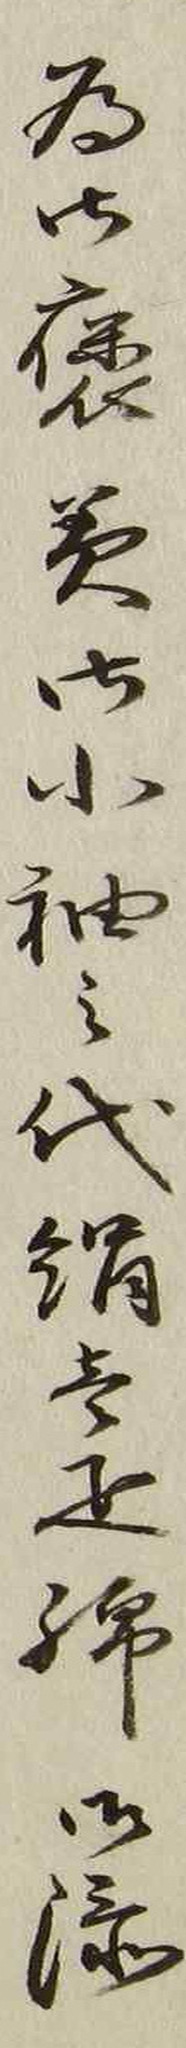為御褒美御小袖之代絹壱疋綿御添
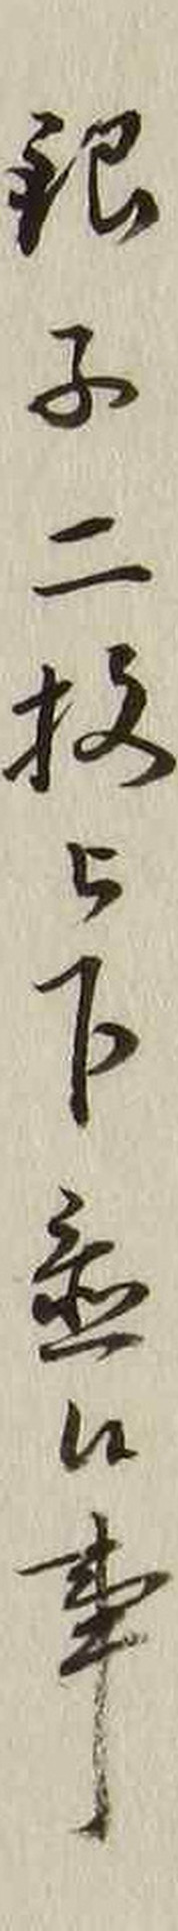銀子二枚被下置候事
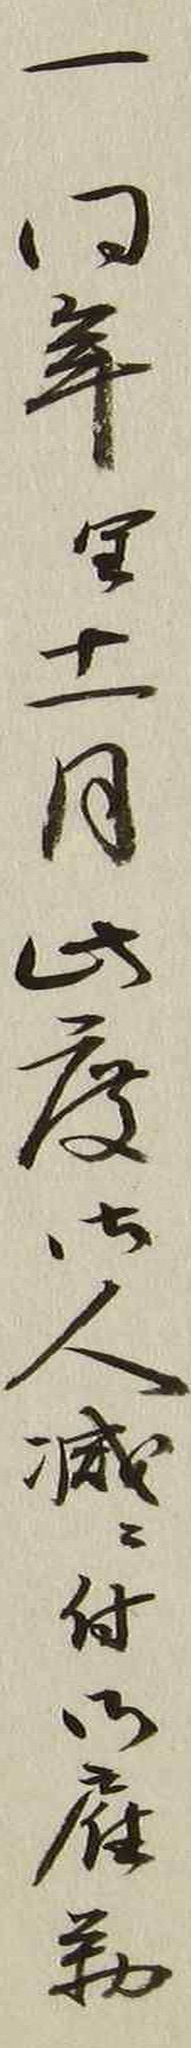一同年酉十一月此度御人減ニ付御雇勤
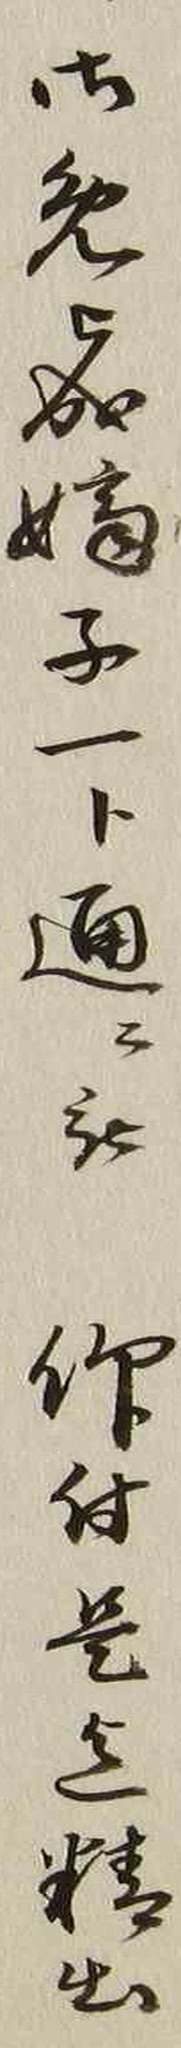御めみえ成嫡子一卜通に被仰付是迄精出
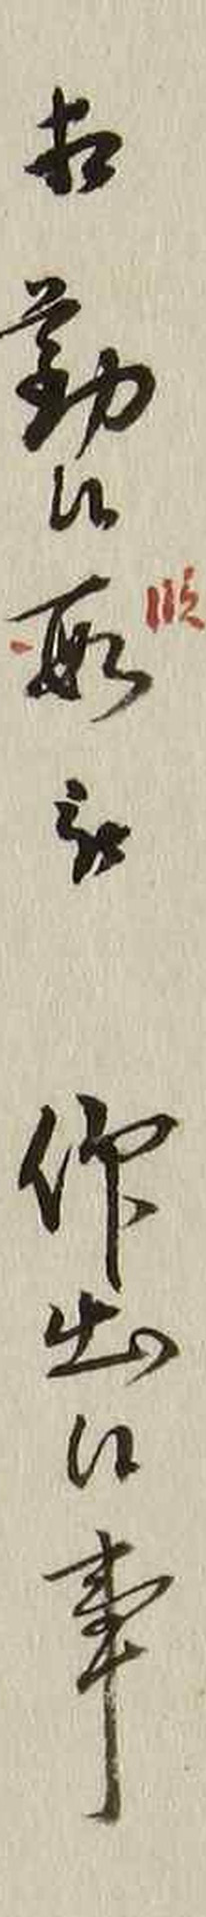相勤候所被仰出候事
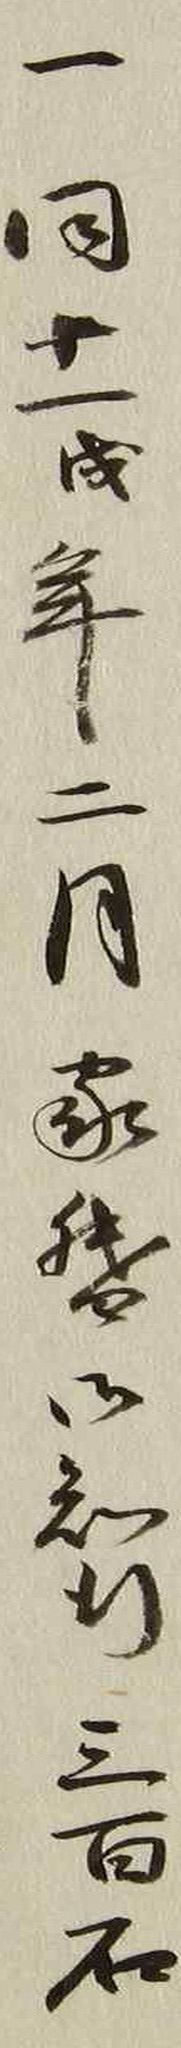一同年戌年二月家督御知行三百石
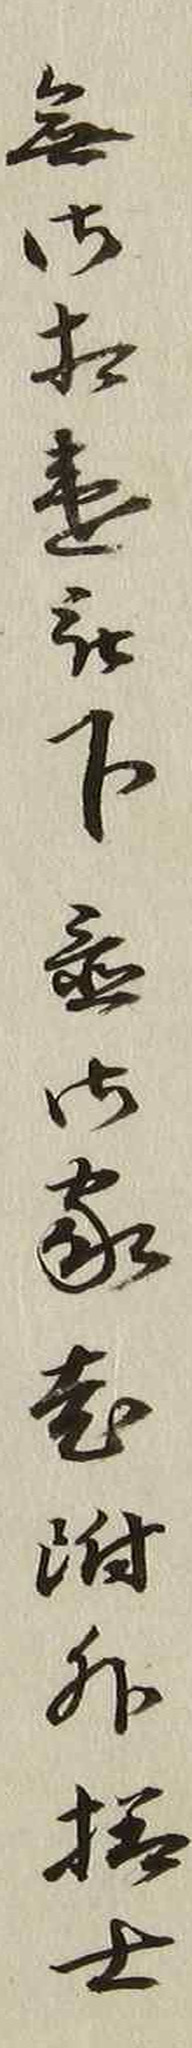無御相れ被下置御家老附外様士
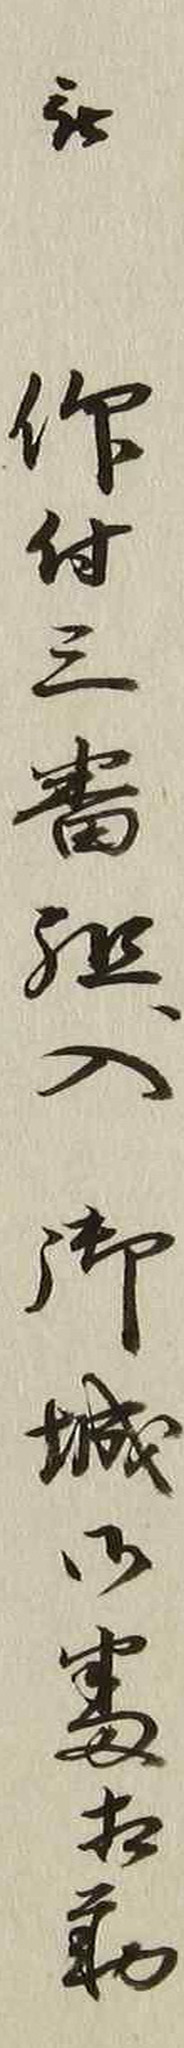被仰付三番組入御城御番相勤
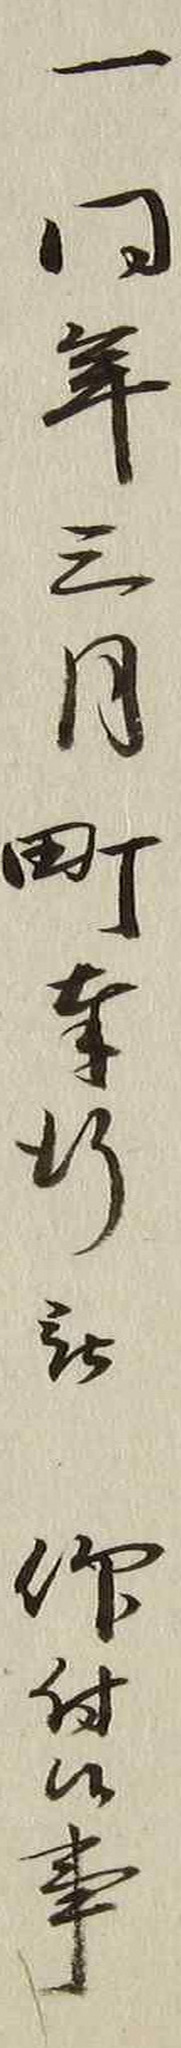一同年三月町奉行被仰付候事
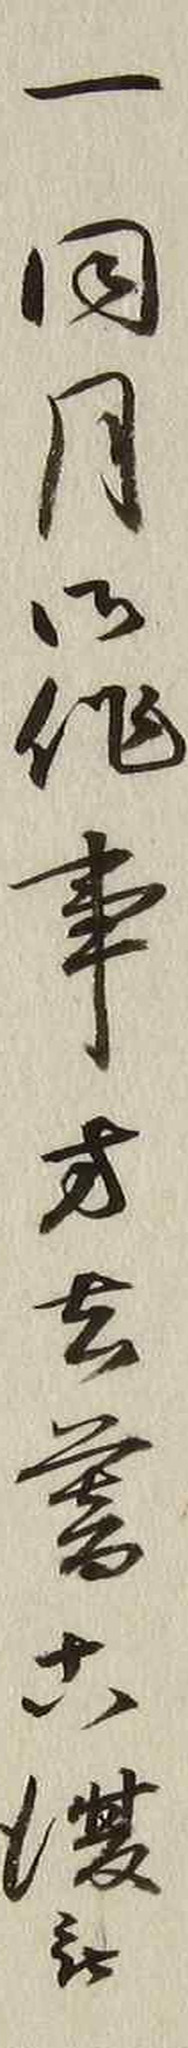一同月御作事方去暮この被
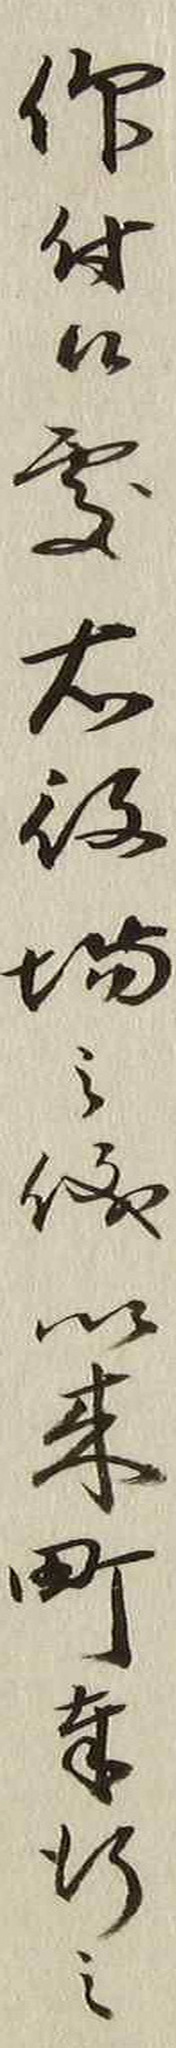仰付候処右役坊之儀以来町奉行之
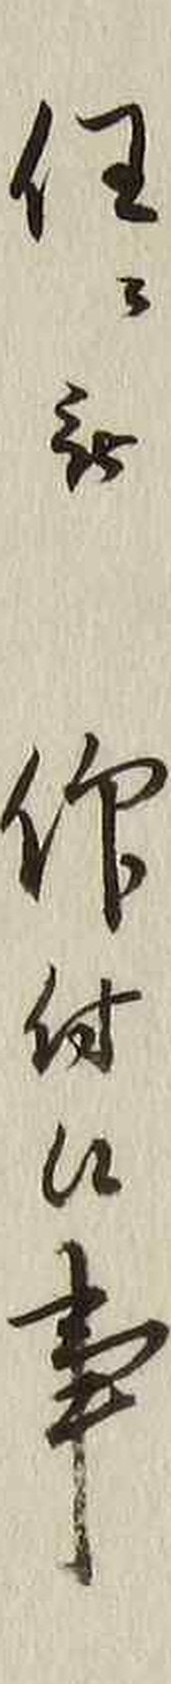任に被仰付候事
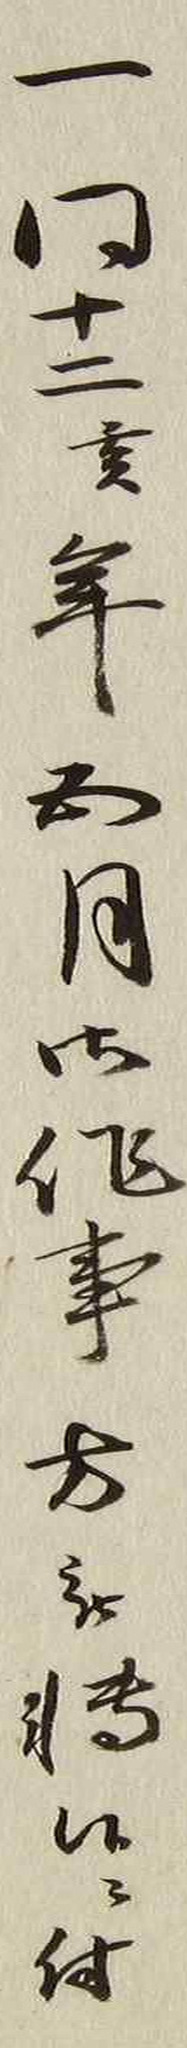一同十二亥年五月御作事方被転候に付
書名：諸士系譜　巻之160　な之部2
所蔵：会津若松市立会津図書館
